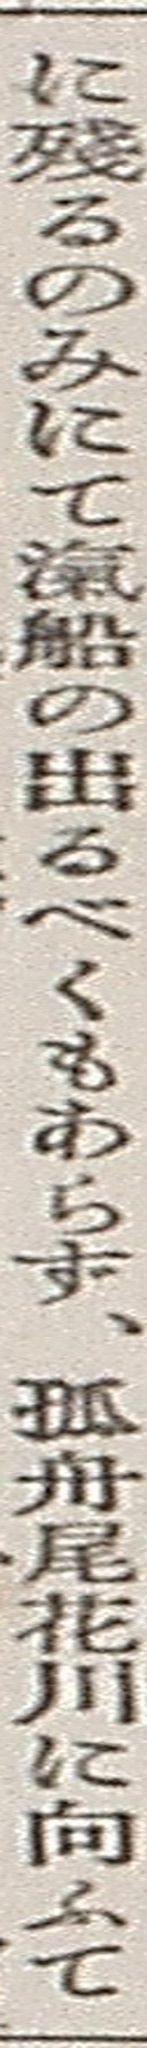に残るのみにて汽船の出るべくもあらず、孤舟尾花川に向ふて
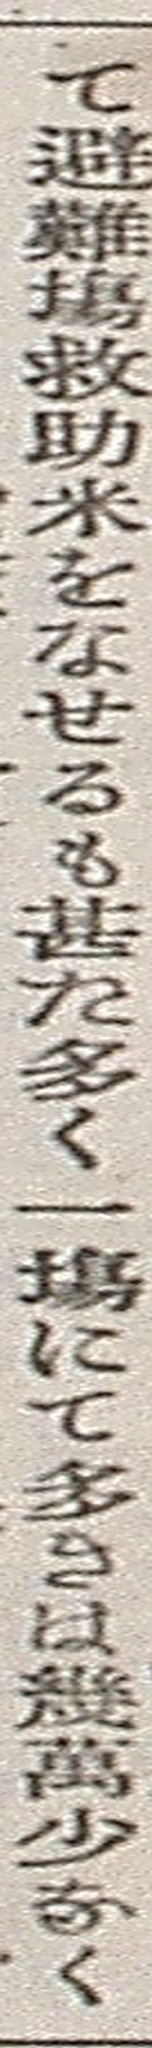て避難場救助米をなせるも甚だ多く一場にて多きは幾万少なく
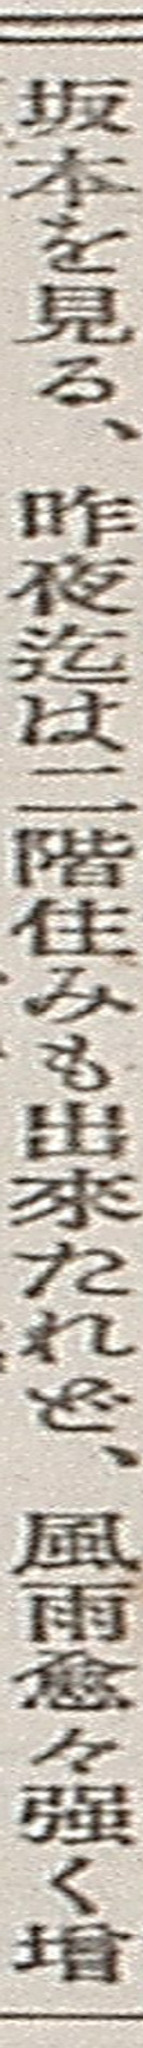坂本をみる、昨夜迄は二階住みも出来たれど、風雨愈々強く増
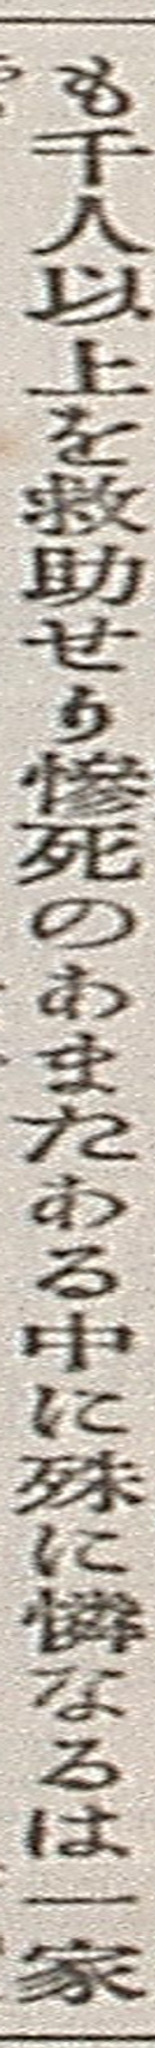も千人以上を救助せり惨死のあまたある中に殊に憐なるは一家
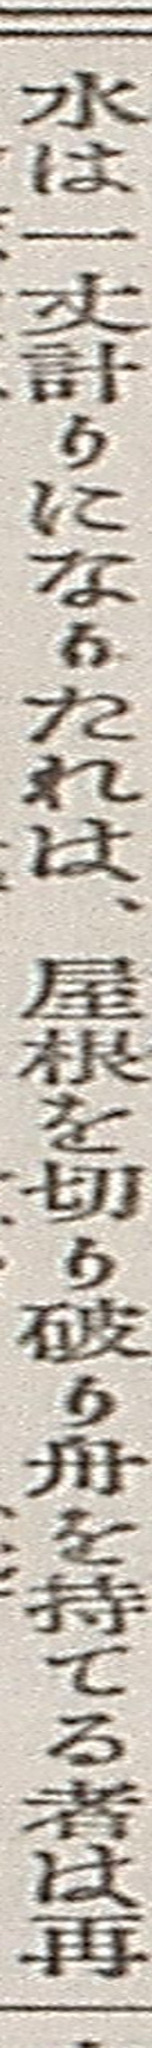水は一丈計りになりたれば、屋根を切り破り舟を持てる者は再
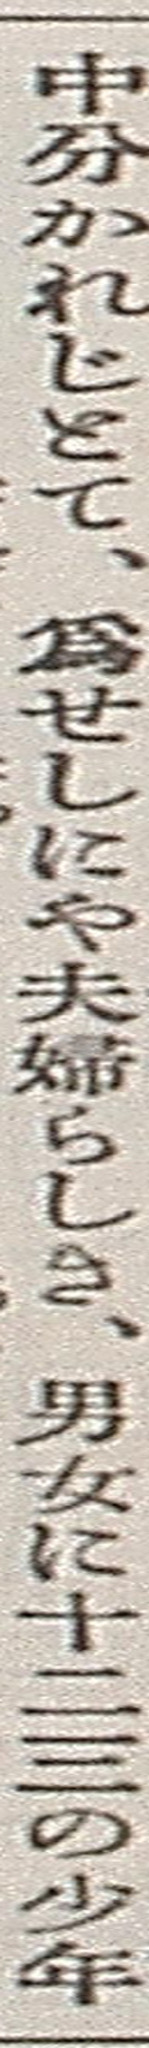中分かれじとて、為せしにや夫婦らしき、男女に十二三の少年
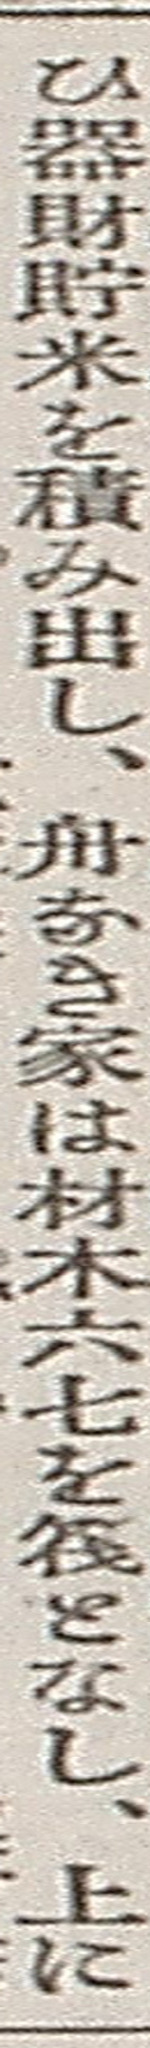ひ器財貯米を積み出し、舟なき家は材木五六を筏となし、上に
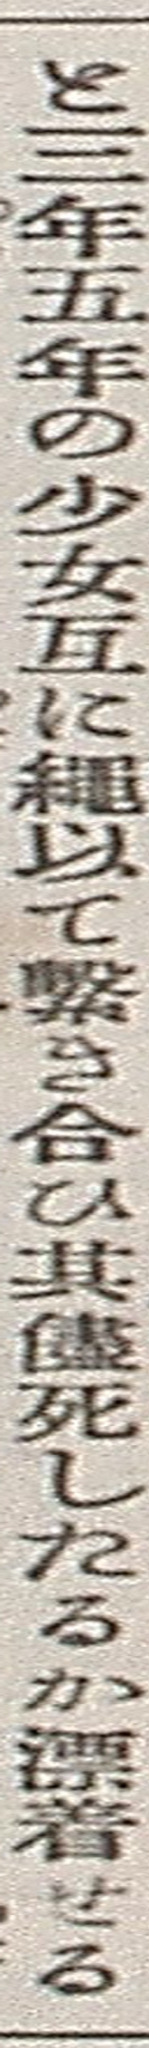と三年五年の少女互に縄以て繋き合ひ其儘死したるか漂着せる
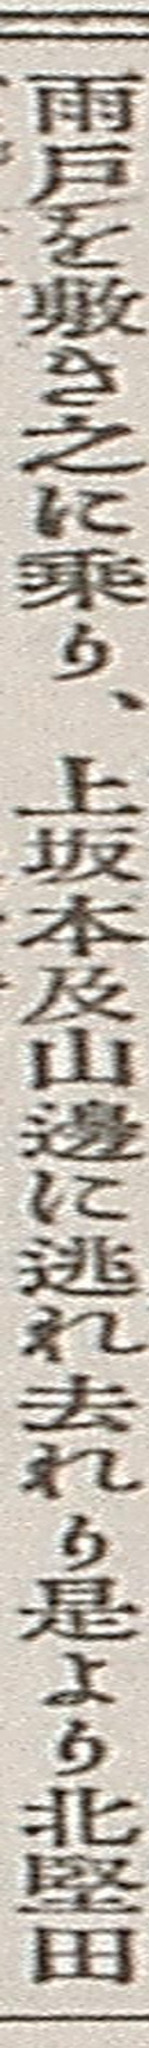雨戸を敷き之に乗り、上坂本及山辺に逃れ去れり是より北堅田
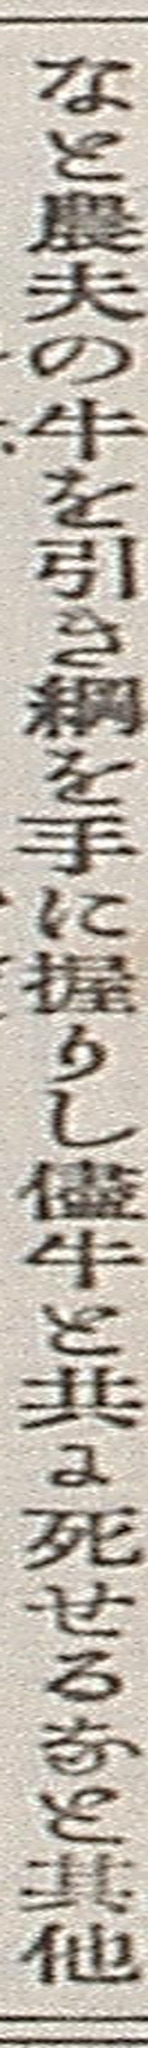など農夫の牛を引き綱を手に握りし儘牛と共に死せるなと其他
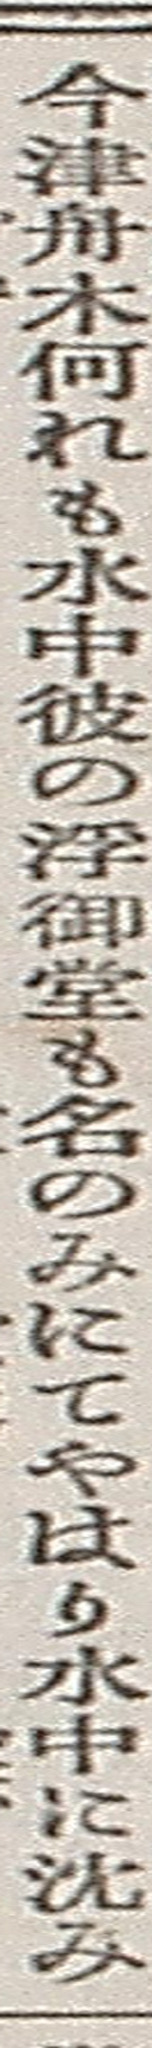今津舟木何れも水中彼の浮御堂も名のみにてやはり水中に沈み
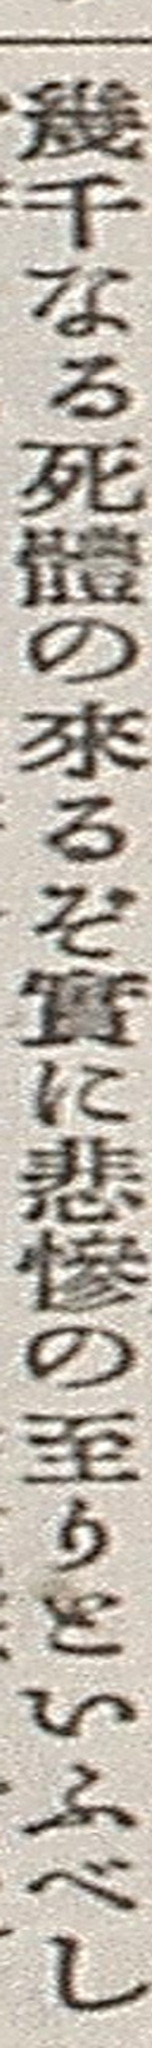幾千なる死体の来るぞ実に悲惨の至りといふべし
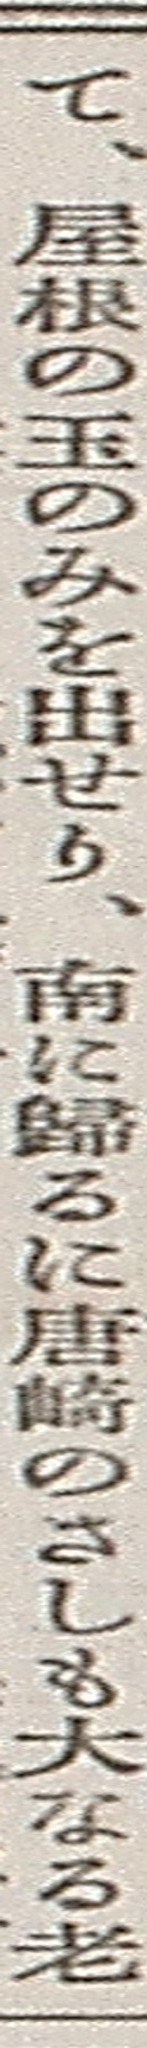て、屋根の玉のみを出せり、南に帰るに唐崎のさしも大なる老
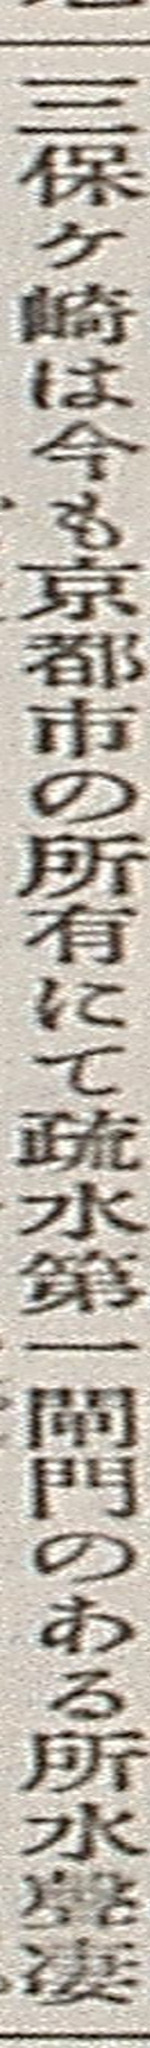三保ヶ崎は今も京都市の所有にて疎水第一閘門のある所水声凄
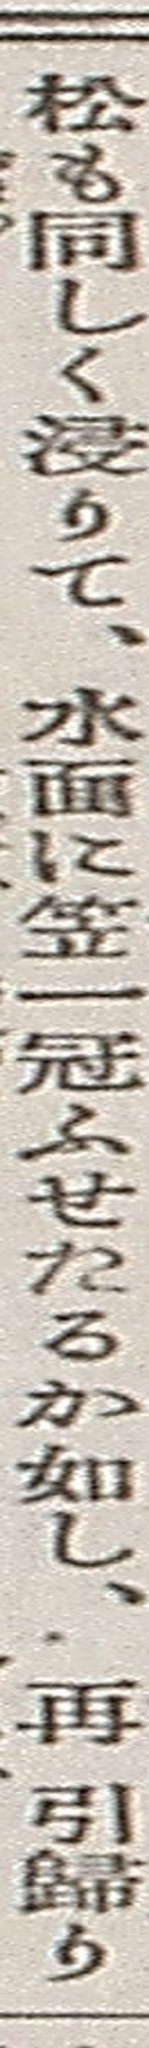松も同しく浸りて、水面に笠一冠ふせたるが如し、再引帰り
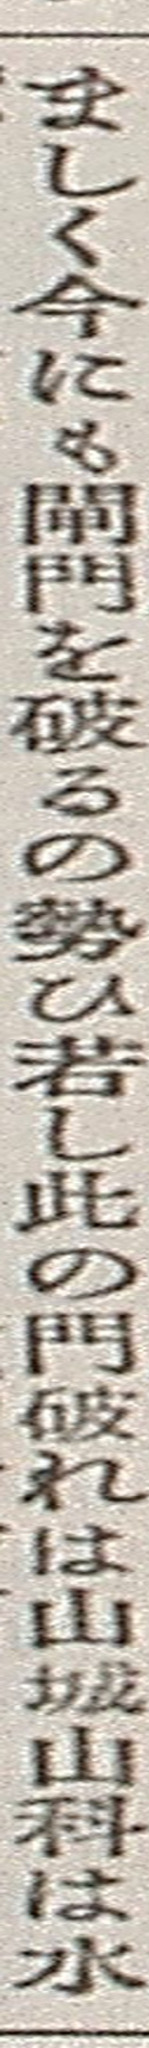ましく今にも閘門を破るの勢ひ若し此の門破れは山城山科は水
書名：風俗畫報臨時増刊第百二十八號　洪水被害録（下）
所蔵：東京大学地震研究所図書室 Earthquake Research Institute Library, The University of Tokyo, JAPAN
